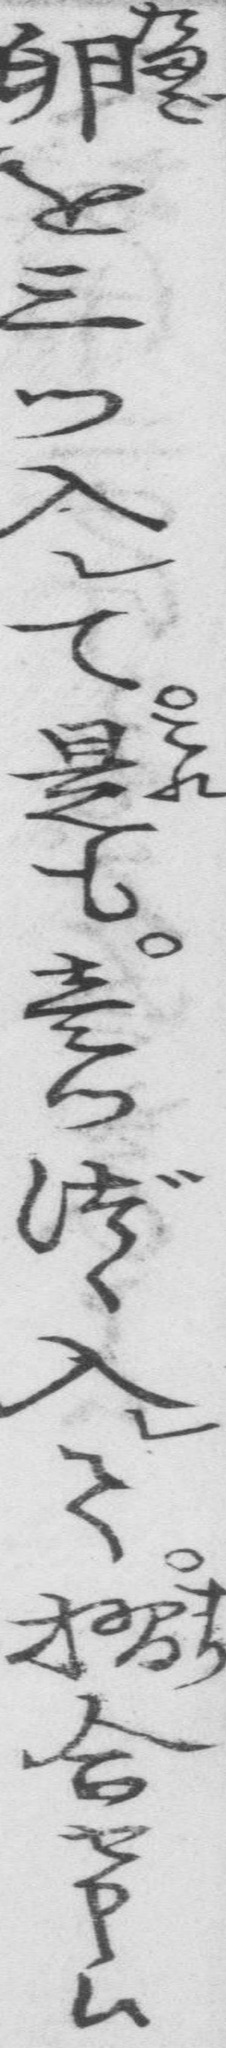卵を三ツ入れて。是も壱ツづゝ入れて。摺合せ申候
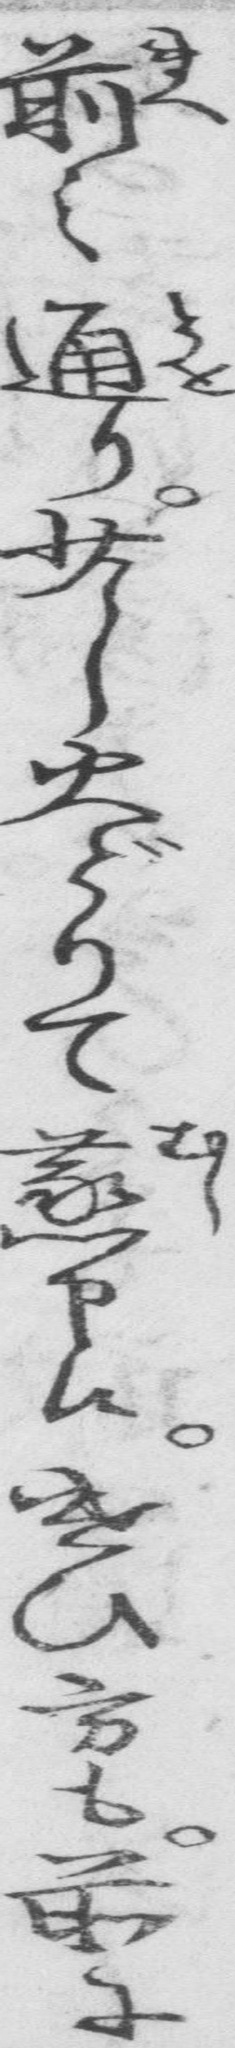前之通り。少し火どりて蒸申候。遣ひ方も。前に
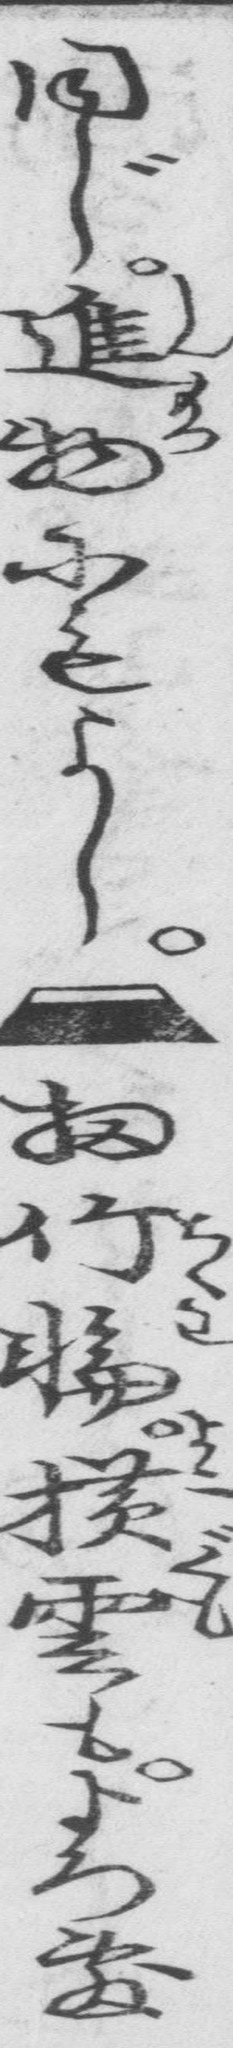同じ。進物にもよし。扨竹輪。横雲も。よろ敷
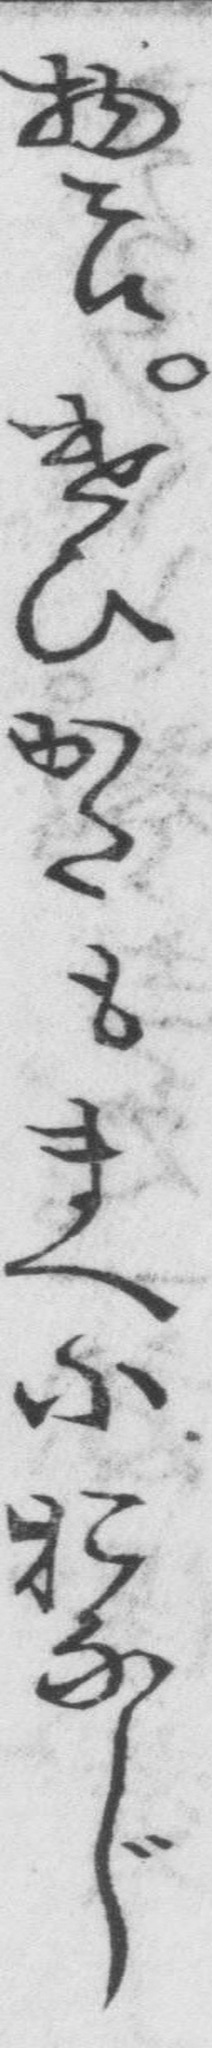物に候。遣ひかたもまへにおなじ
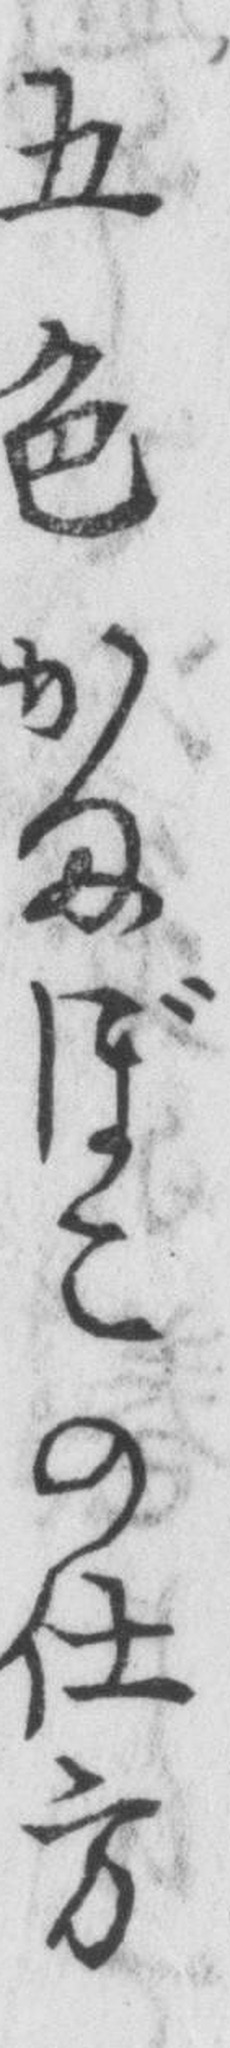五色かまぼこの仕方
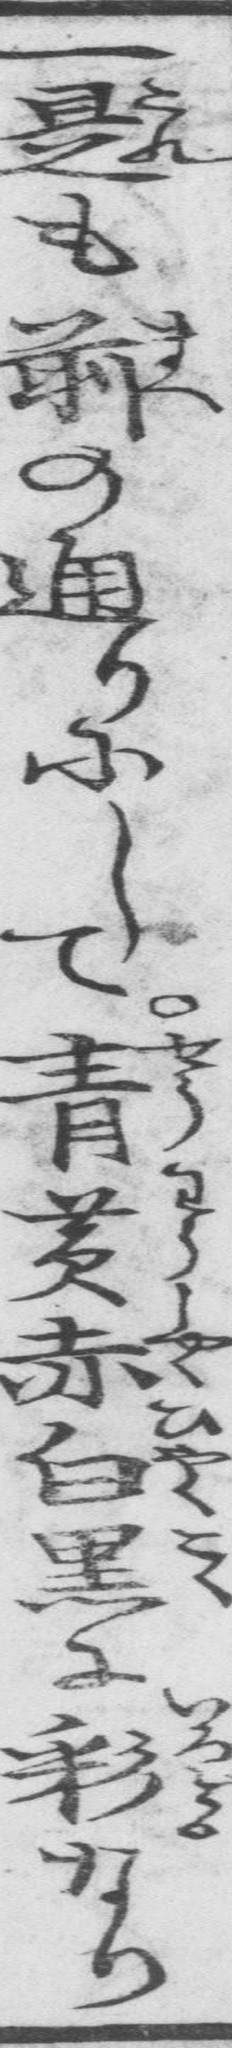一是も前の通りにして。青黄赤白黒に彩なり
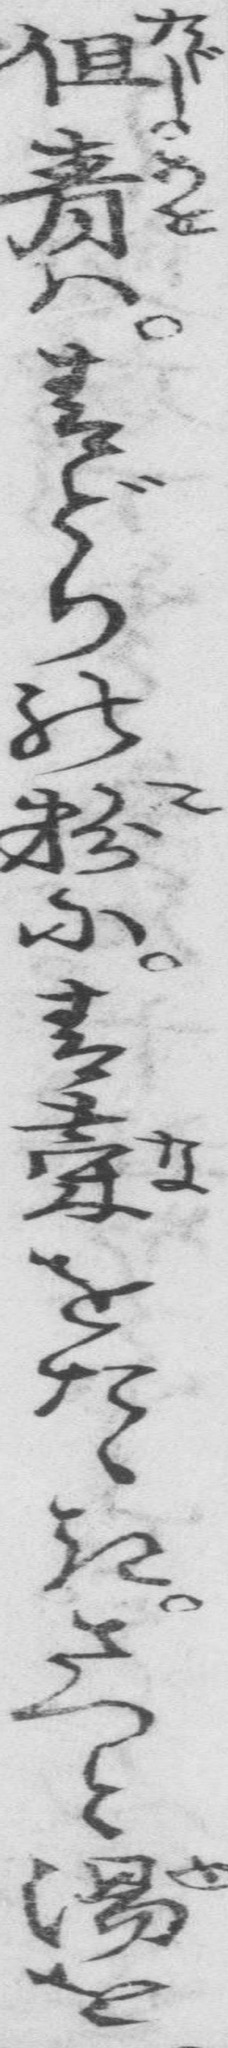但。青は。青どりの粉に。青菜をたゝき。さつと湯を
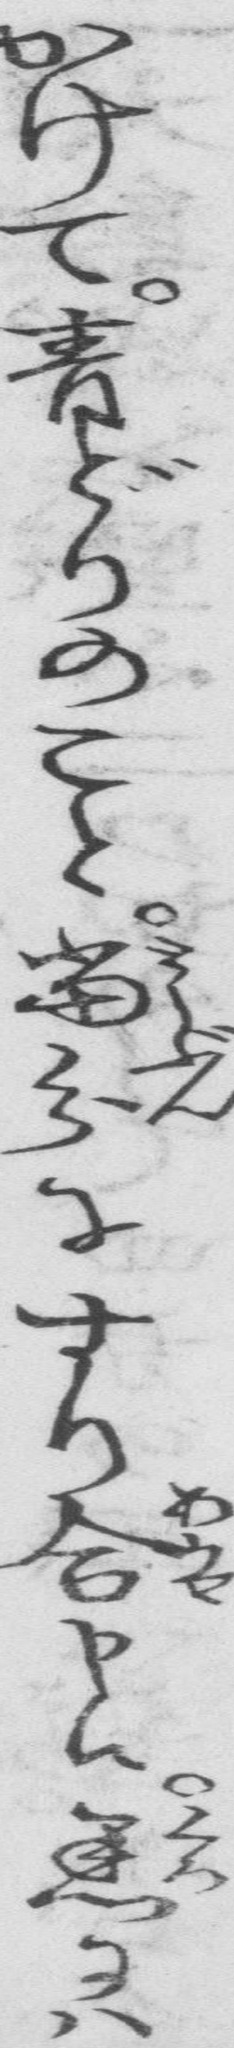かけて。青どりのこと。当分にすり合申候。。黒には
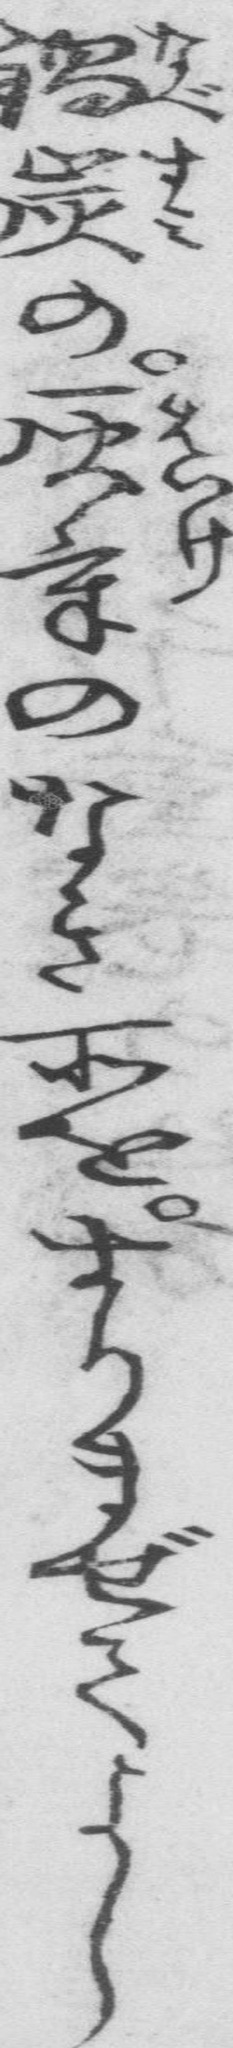鍋炭の。灰気のなき所を。すりまぜてよし

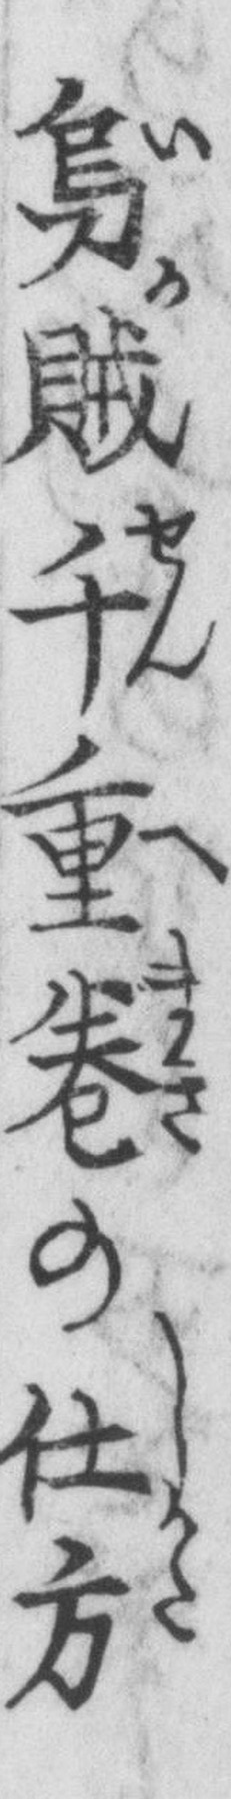烏賊千重巻の仕方
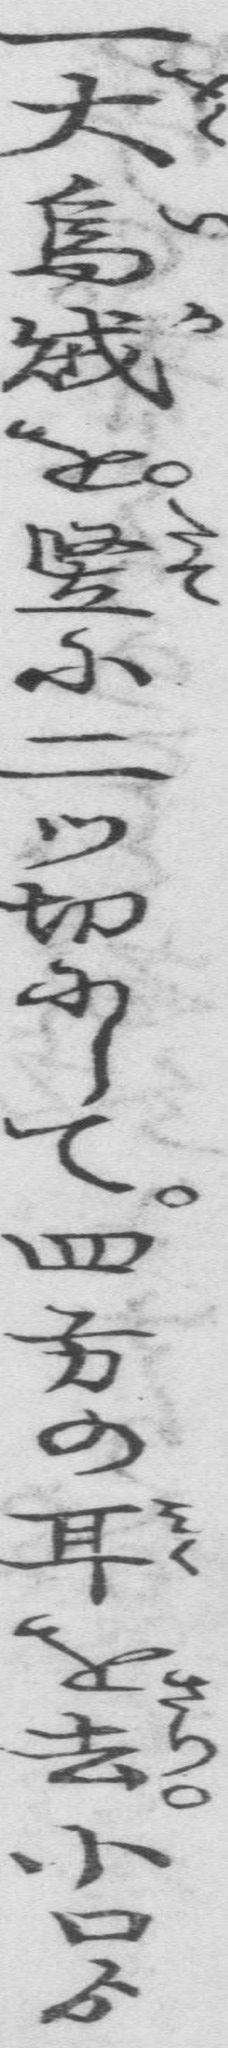一大烏賊を。竪に二ツ切にして。四方の耳を去。小口ゟ
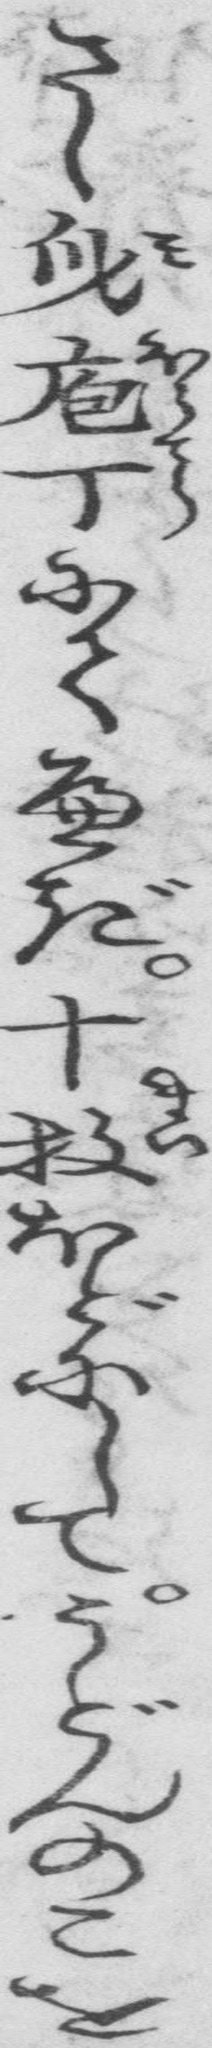さし身包丁にてへぎ。十枚ほどにして。うどんのこを
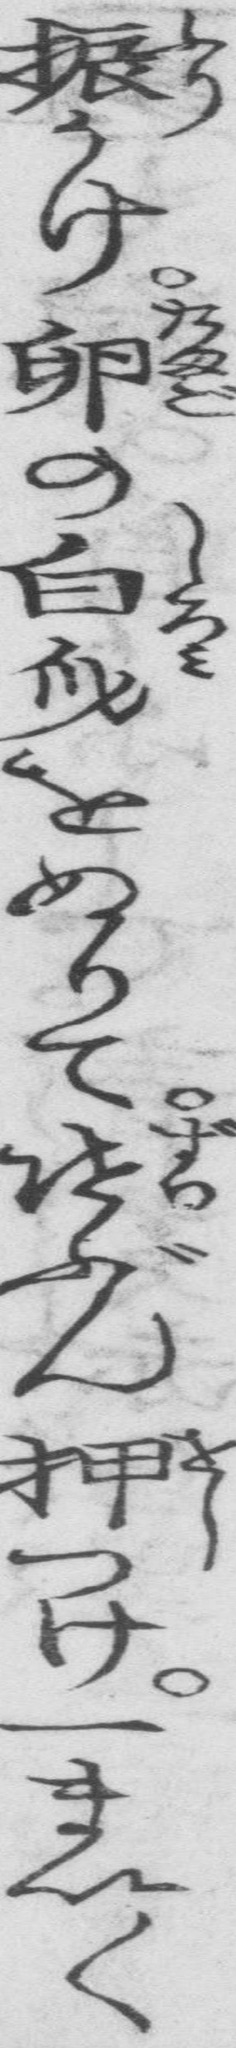振かけ。卵の白身をぬりて。随ぶん押つけ。一まい〳〵
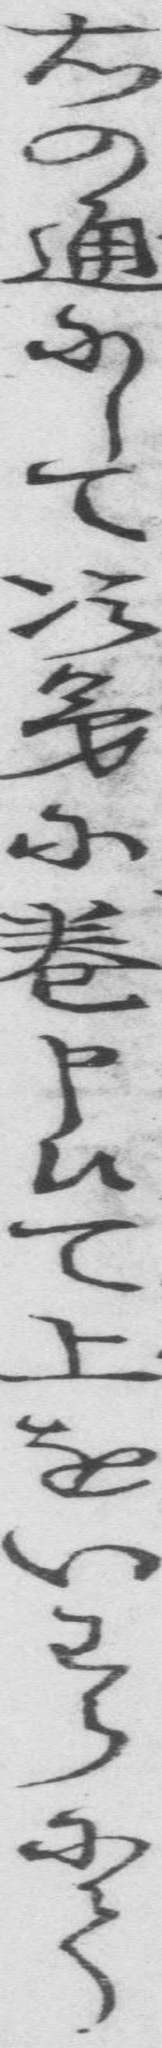右の通にして。次第に巻申候て。上をいわらにて
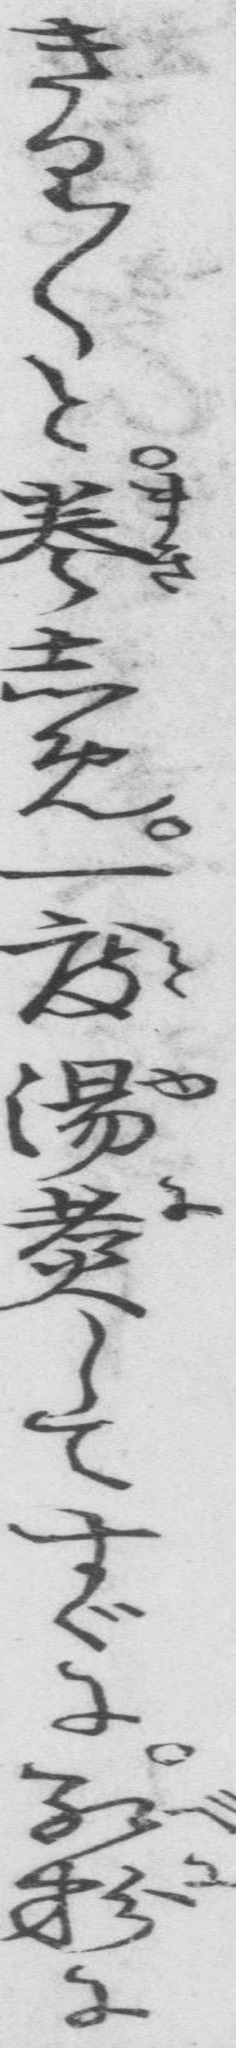きり〳〵と。巻しめ。一度湯煮してすぐに。紅粉に
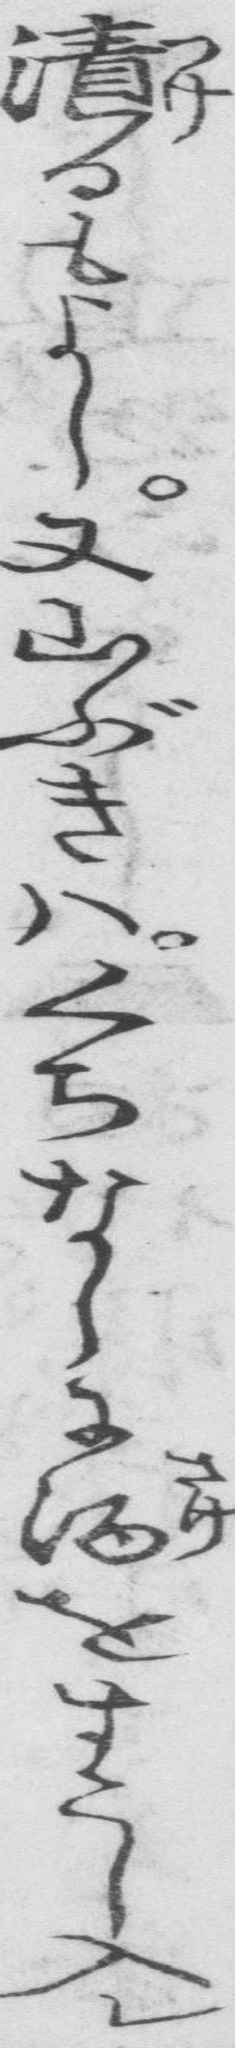漬るもよし。又山ぶきは。くちなしに酒をすこし入れ
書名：萬寳料理秘密箱
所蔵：大阪府立大学学術情報センター 国文学研究資料館
